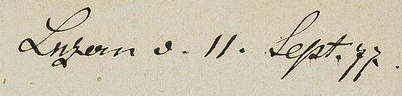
Luzern d. 11. Sept. 77.
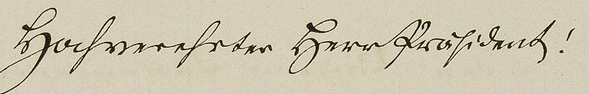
Hochverehrter Herr Präsident!
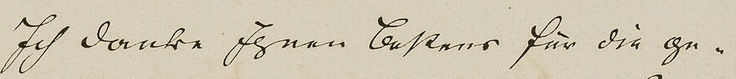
Ich danke Ihnen bestens für die ge-
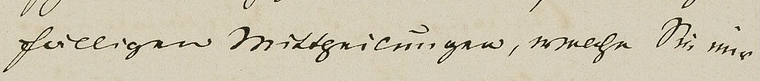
fälligen Mittheilungen, welche Sie mir
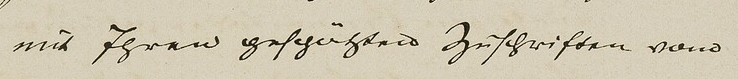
mit Ihren geschätzten Zuschriften vom
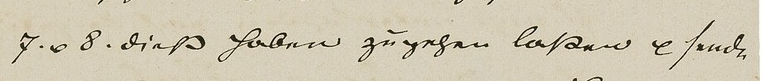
7. & 8. dieß haben zugehen laßen & sende
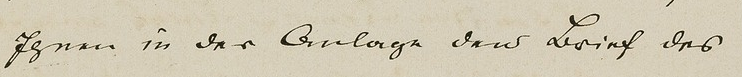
Ihnen in der Anlage den Brief des
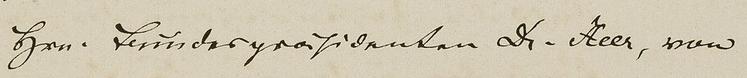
Hrn. Bundespräsidenten Dr. Heer, von
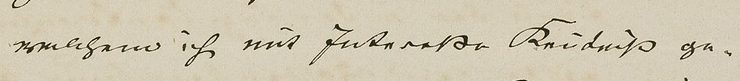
welchem ich mit Intereße Kenntniß ge-
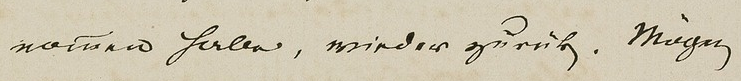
nommen habe, wieder zurük. Mögen
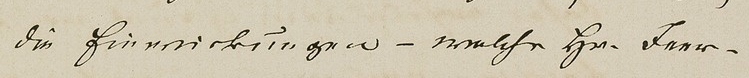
die Einwirkungen – welche Hr. Feer-
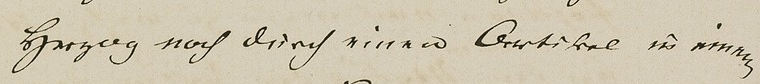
Herzog noch durch einen Artikel in einem
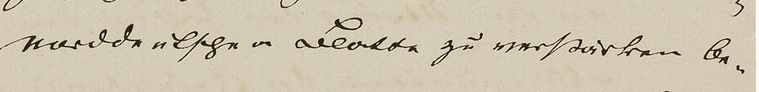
norddeutschen Blatte zu verstärken be-
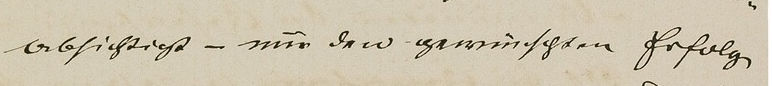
absichtigt – nur den gewünschten Erfolg
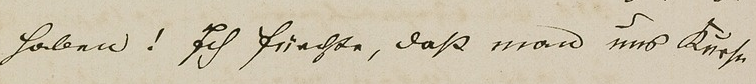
haben! Ich fürchte, daß man uns Kurse
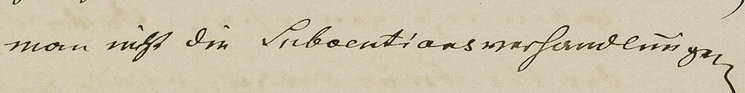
man nicht die Subventionsverhandlungen
